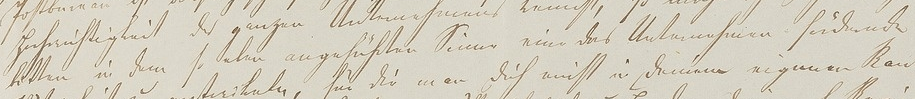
bitten in dem so eben angeführten Sinne eine das Unternehmen fördernde
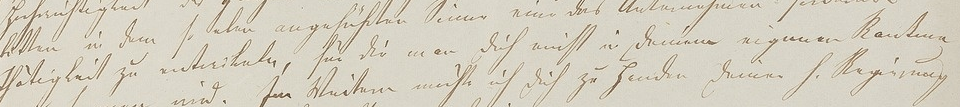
Thätigkeit zu entwikeln, für die man Dich einst in Deinem eigenen Kantone
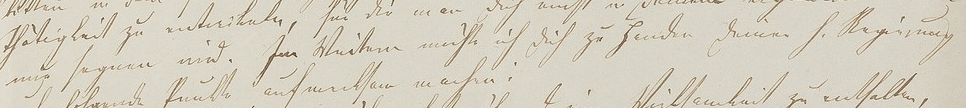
nur segnen wird. Im Weitern möchte ich Dich zu Handen Deiner h. Regierung
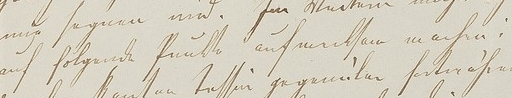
auf folgende Punkte aufmerksam machen:
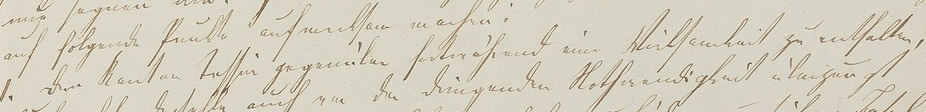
1. Dem Kanton Tessin gegenüber fortwährend eine Wirksamkeit zu entfalten,
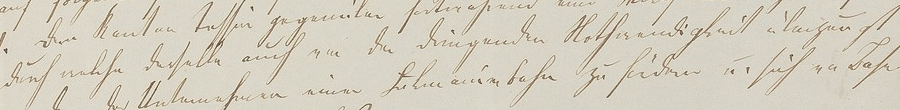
durch welche derselbe auch von der dringenden Nothwendigkeit überzeugt
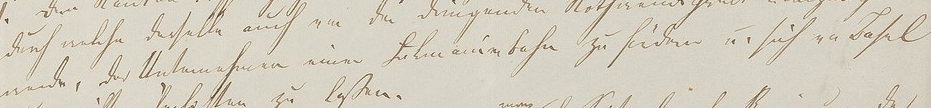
werde, das Unternehmen einer Lukmanierbahn zu fördern u. sich von Basel
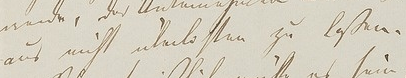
aus nicht überlasten zu laßen.
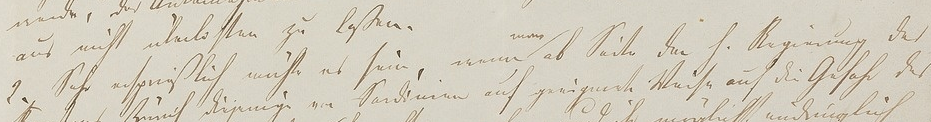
2. Sehr ersprießlich möchte es sein, wenn man ab Seite der h. Regierung des
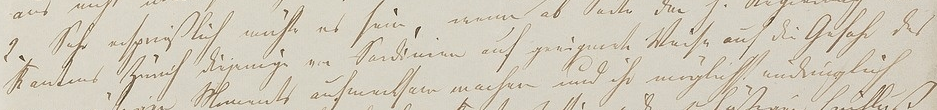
Kantons Zürich diejenige von Sardinien auf prägende Weise auf die Gefahr des
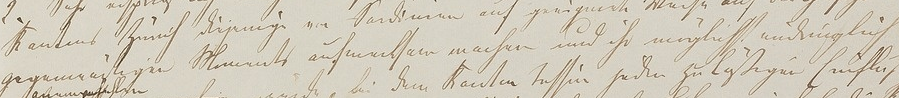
gegenwärtigen Moments aufmerksam machen und ihr möglichst eindringlich
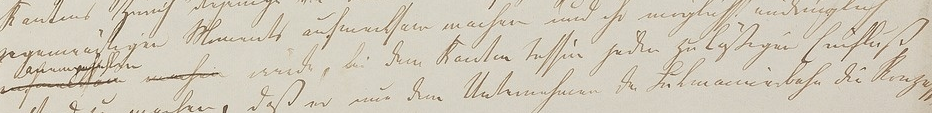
anempfehlen würde, bei dem Kanton Tessin jeden zuläßigen Einfluß
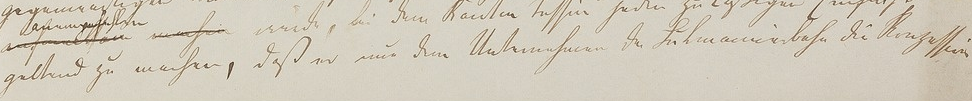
geltend zu machen, daß er nur dem Unternehmen der Lukmanierbahn die Konzession
